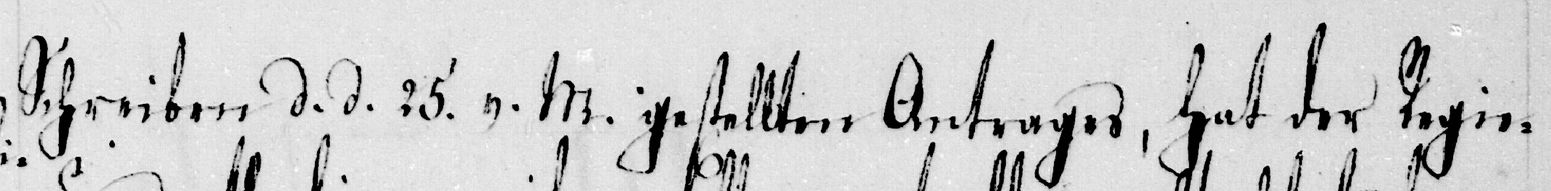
Schreiben d. d. 25. v. M. gestellten Antrages, hat der Regie¬
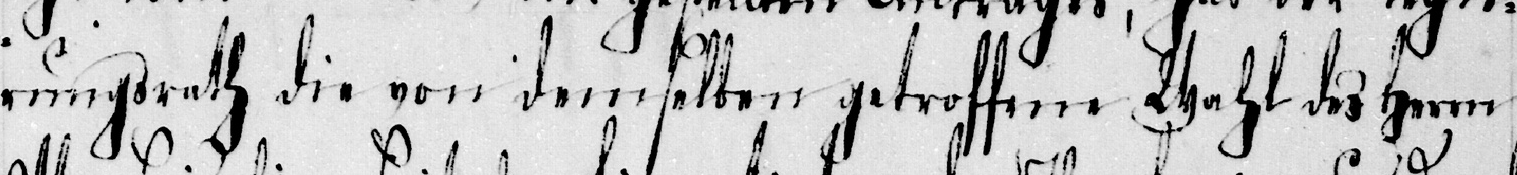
rungsrath die von demselben getroffene Wahl des Herrn
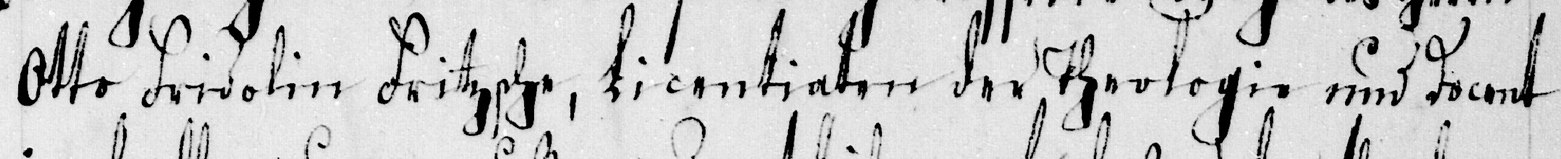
Otto Fridolin Fritzsche, Licentiaten der Theologie und Docent
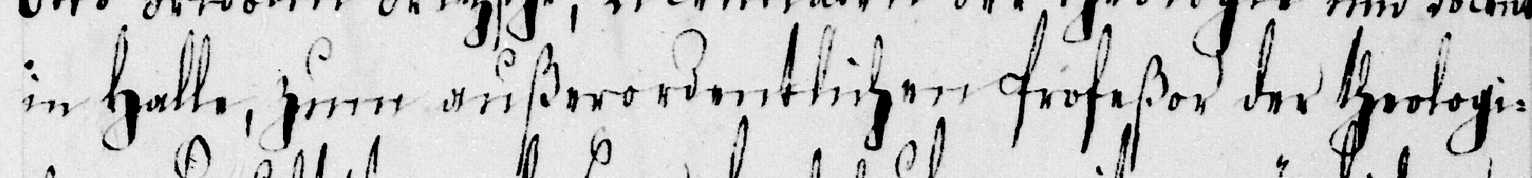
in Halle, zum außerordentlichen Profeßor der theologi¬
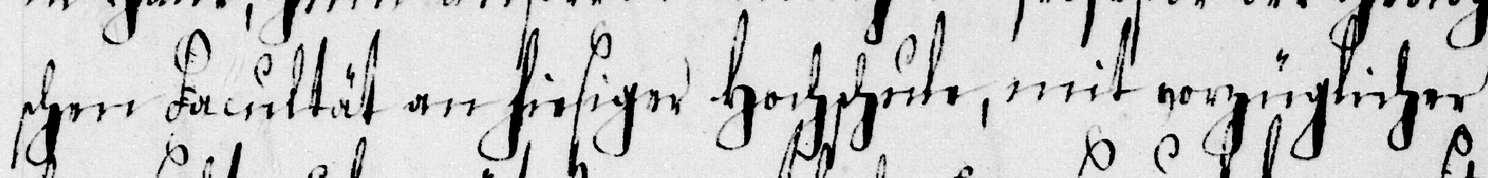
schen Facultät an hiesiger Hochschule, mit vorzüglicher
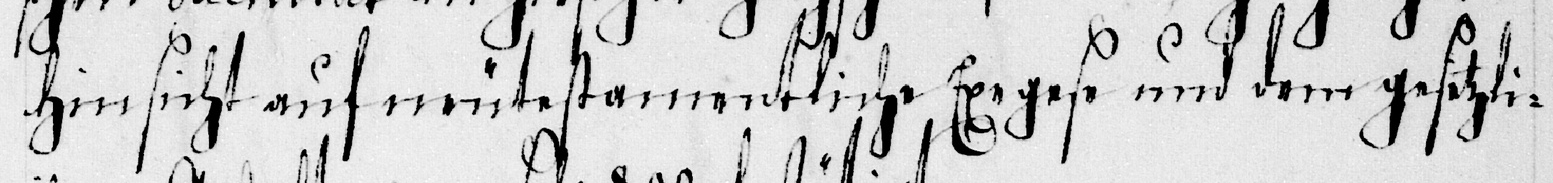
Hinsicht auf neutestamentliche Exegese und dem gesetzli¬
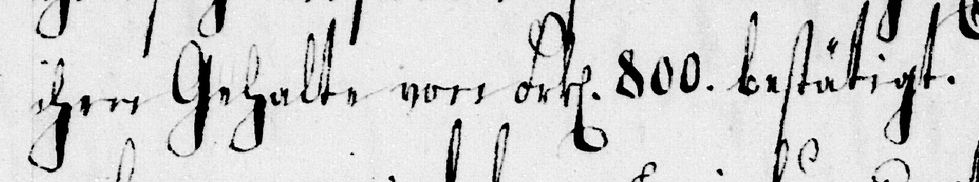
chen Gehalte von Frk[en]. 800. bestätigt.
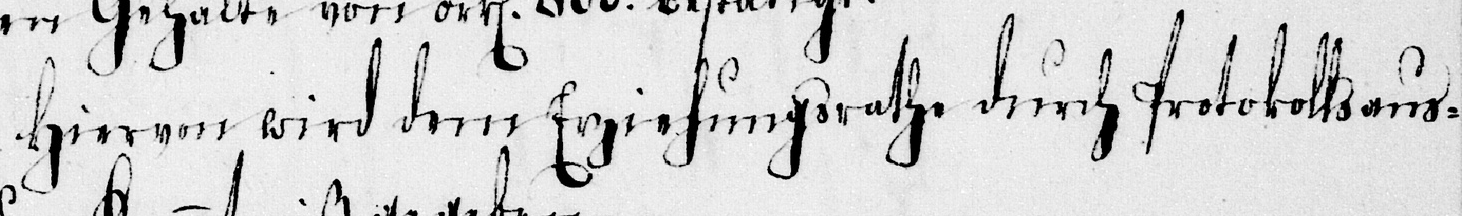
Hiervon wird dem Erziehungsrathe durch Protokollsaus¬
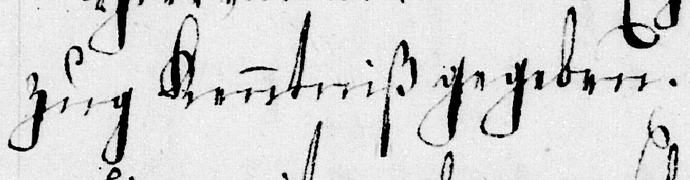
zug Kenntniß gegeben.
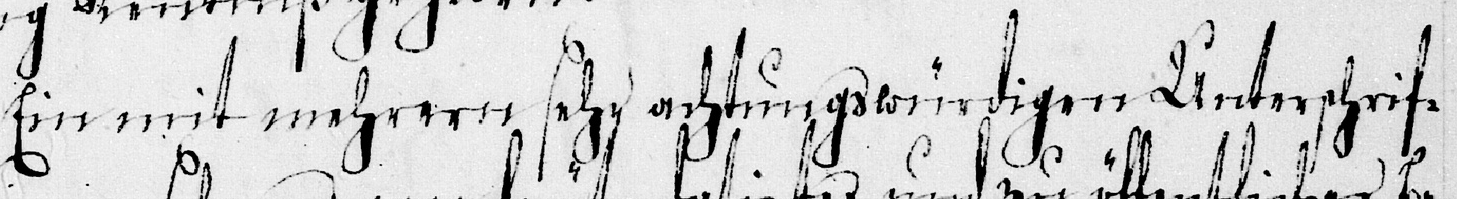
Ein mit mehrern sehr achtungswürdigen Unterschrift¬
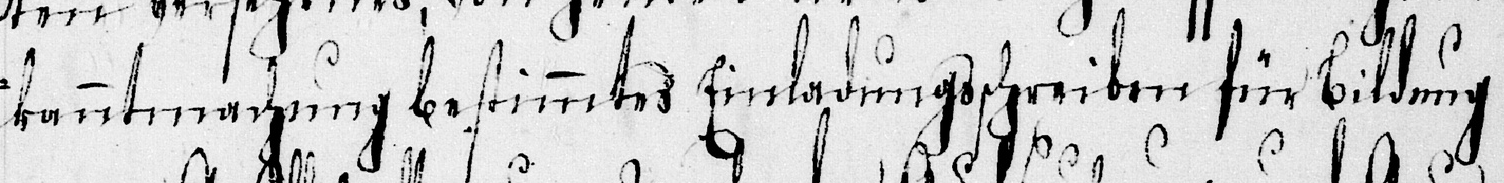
kanntmachung bestimmtes Einladungsschreiben für Bildung
